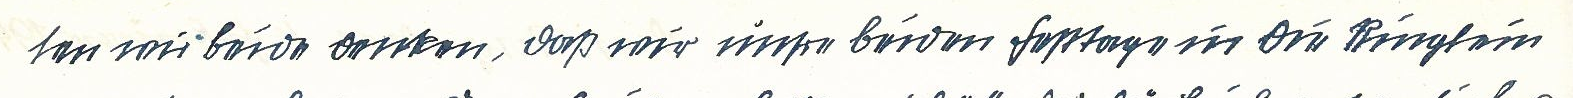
len wir beide denken, daß wir unsre beiden Festtage in die Ringlein
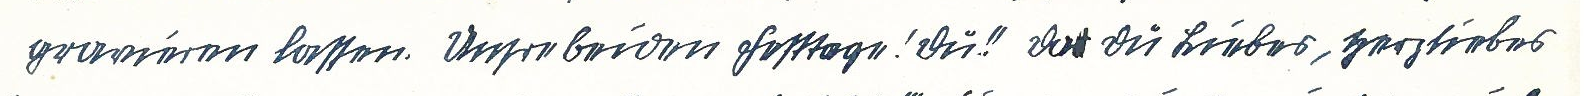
gravieren lassen. Unsre beiden Festtage, Du!! Dar Du Liebes, Herzliebes
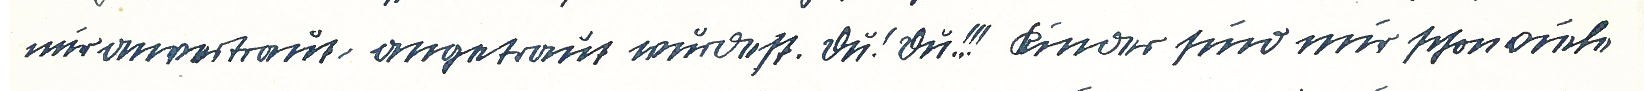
mir anvertraut, angetraut wurdest. Du! Du!!! Kinder sind mir schon viele
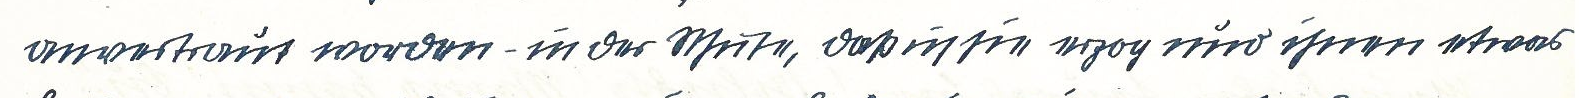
anvertraut worden – in der Schule, daß ich sie erzog und etwas
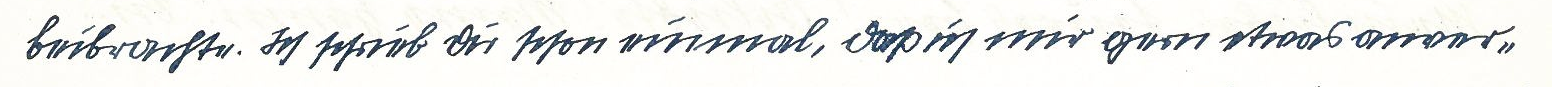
beibrachte. Ich schrieb Dir schon einmal, daß ich mir gern etwas anver¬
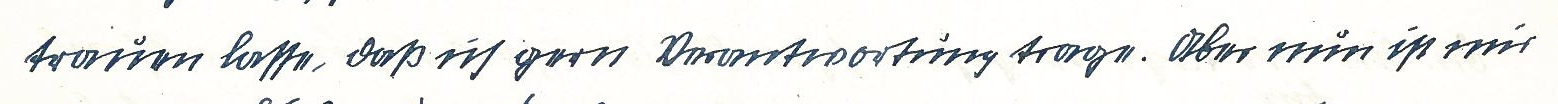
trauen lasse, daß ich gern Verantwortung trage. Aber nun ist mir
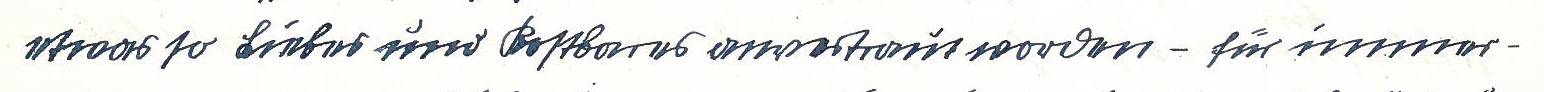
etwas so Liebes und Kostbares anvertraut worden – für immer –
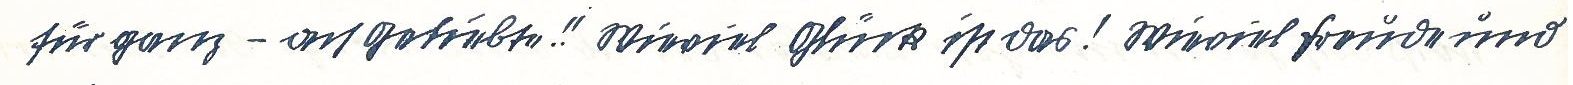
für ganz – ach Geliebte!! Wieviel Glück ist das! Wieviel Freude und
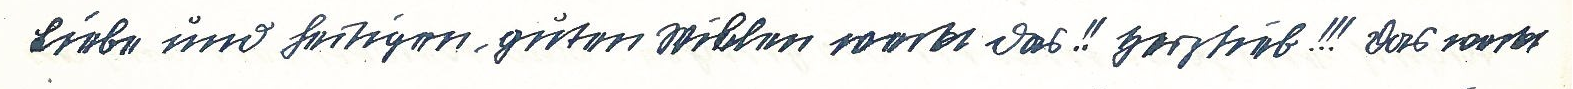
Liebe und heiligen, guten Willen weckt das!! Herzlieb!!! Das weckt
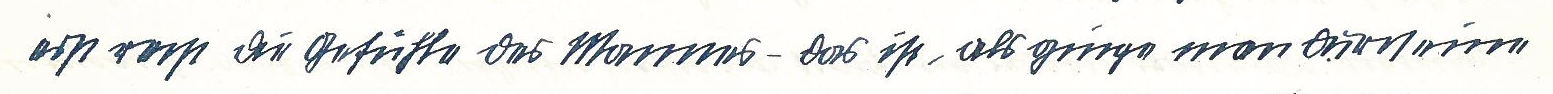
erst recht die Gefühle des Mannes – das ist, als ginge man durch eine
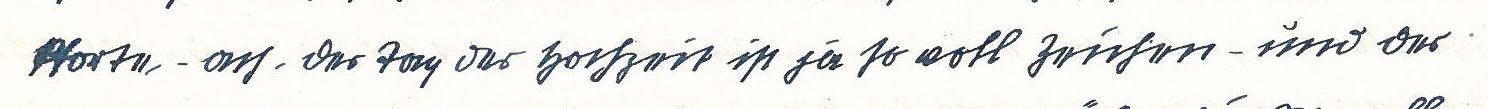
Pforte, – ach, der Tag der Hochzeit ist ja so voll Zeichen – und der
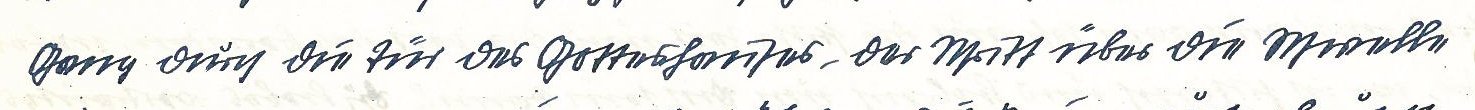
Gang durch die Tür des Gotteshauses, der Schritt über die Schwelle
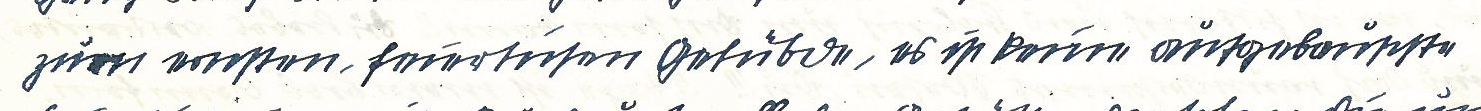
zum ersten, feierlichen Gelübde, es ist keine aufgebauschte
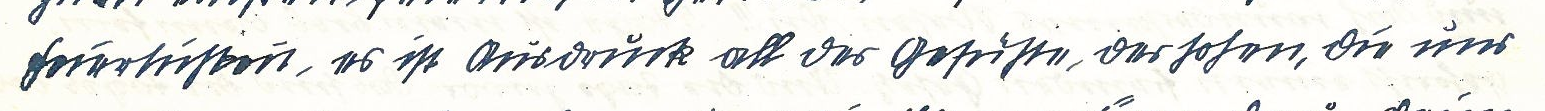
Feierlichkeit, es ist der Ausdruck all der Gefühle, der hohen, die uns
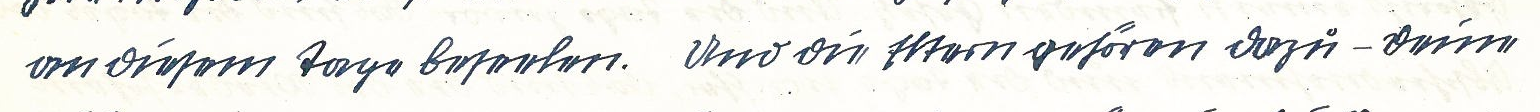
an diesem Tage beseelen. Und die Eltern gehören dazu – Deine
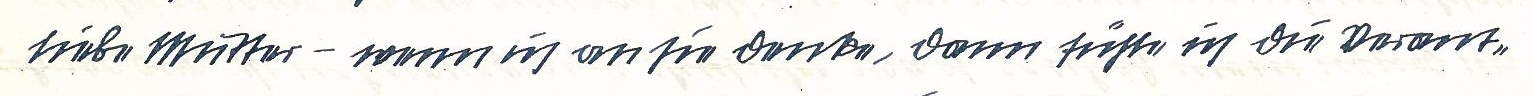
liebe Mutter – wenn ich an sie denke, dann fühle ich die Verant¬
